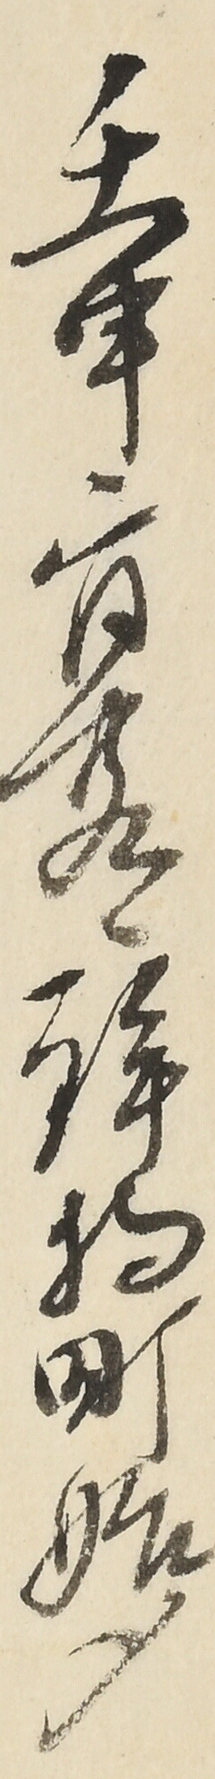壬申二月廿九日鉾持町始メ

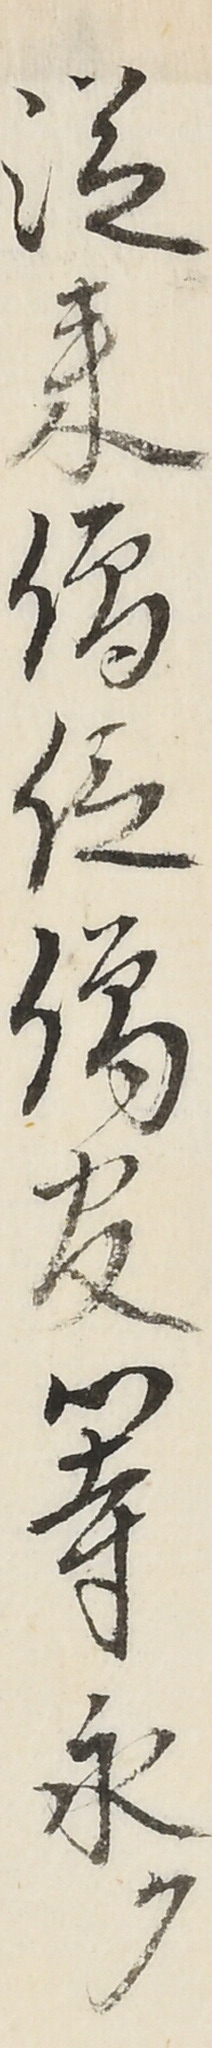従来僧位僧官等永ク
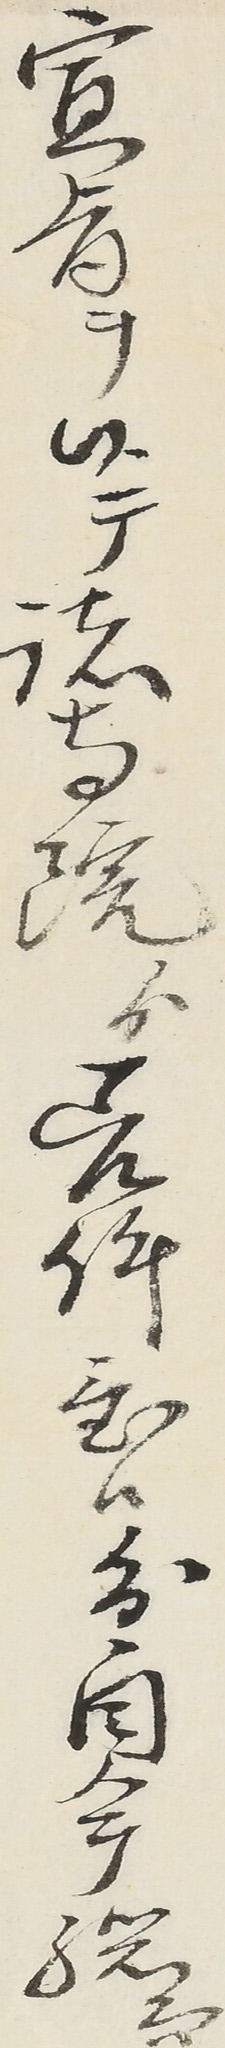宣旨ヲ候テ諸寺院ゟ差許置候分自今総而
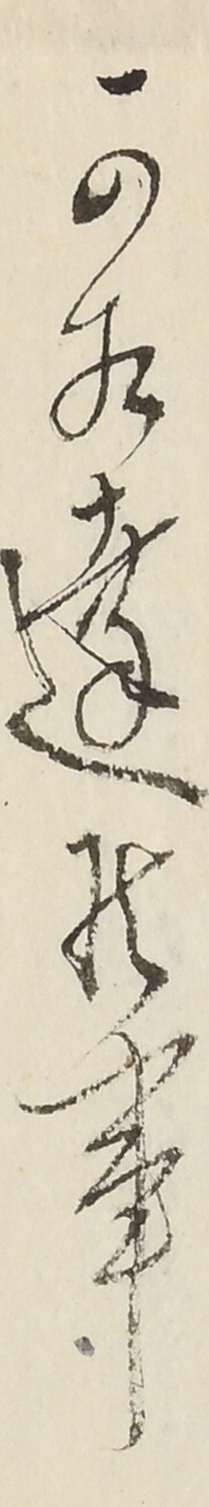可相違候事
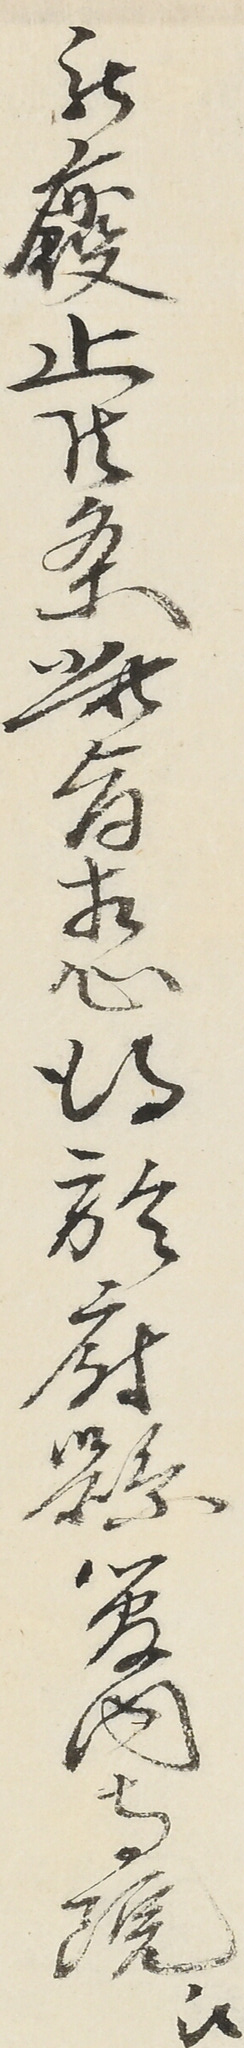被廃止候条此旨相心得於府県管内寺院江
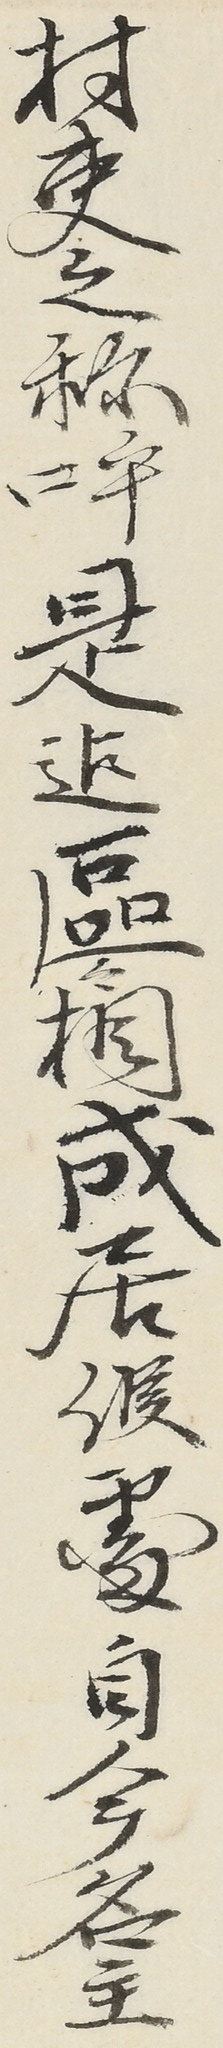村吏之称呼是迄区々相成居候処自今名主
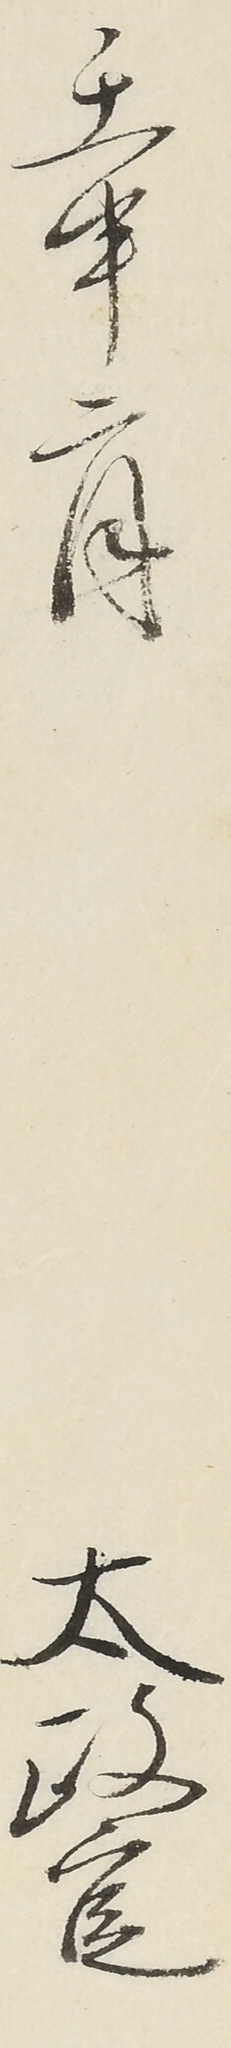壬申二月太政官
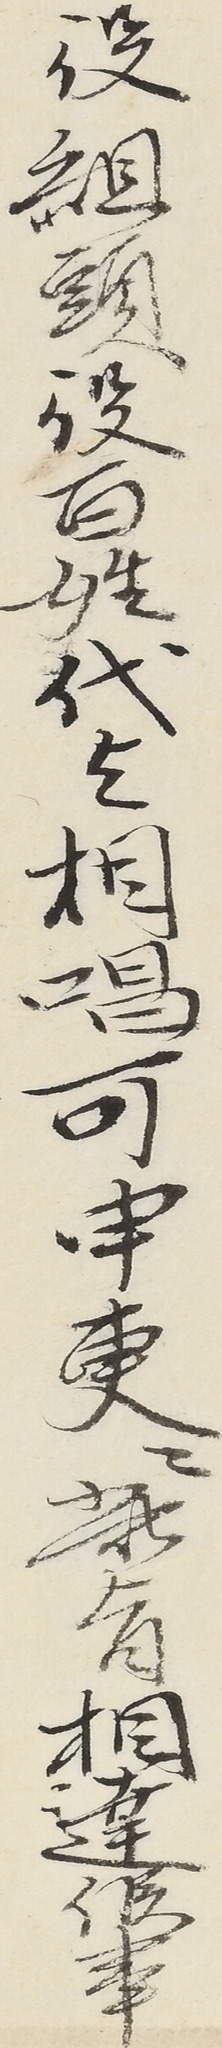役組頭役百姓代与相唱可申吏ニ此旨相達候事

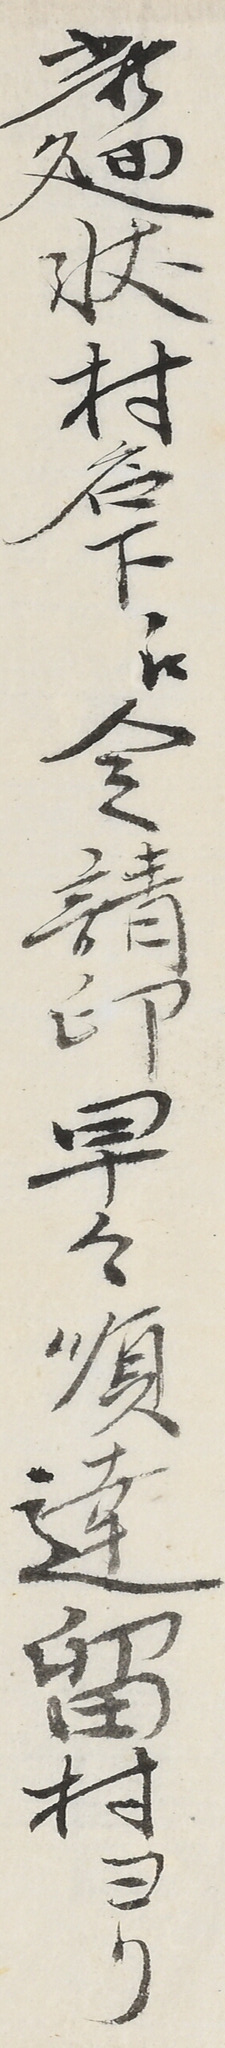此廻状村名江全請印廻々順達留村ヨリ
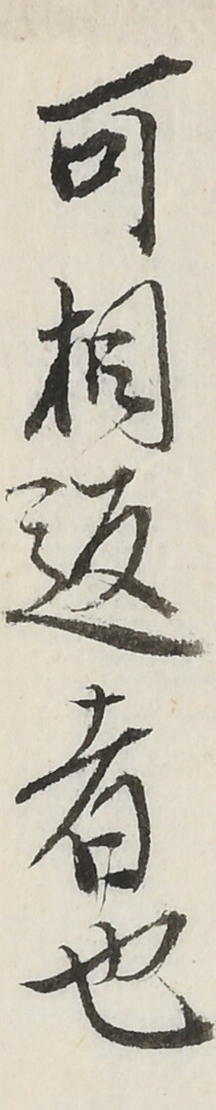可相返者也
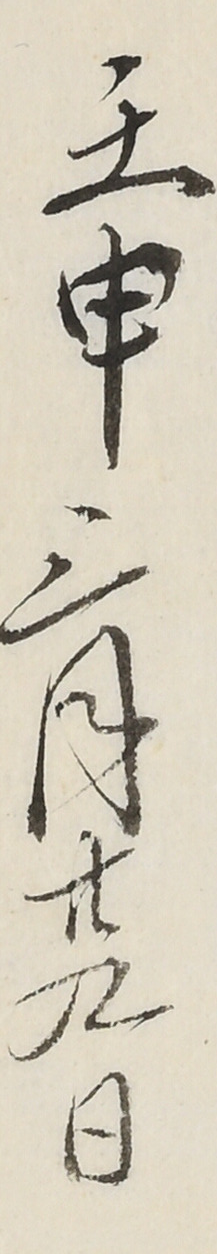壬申三月廿九日
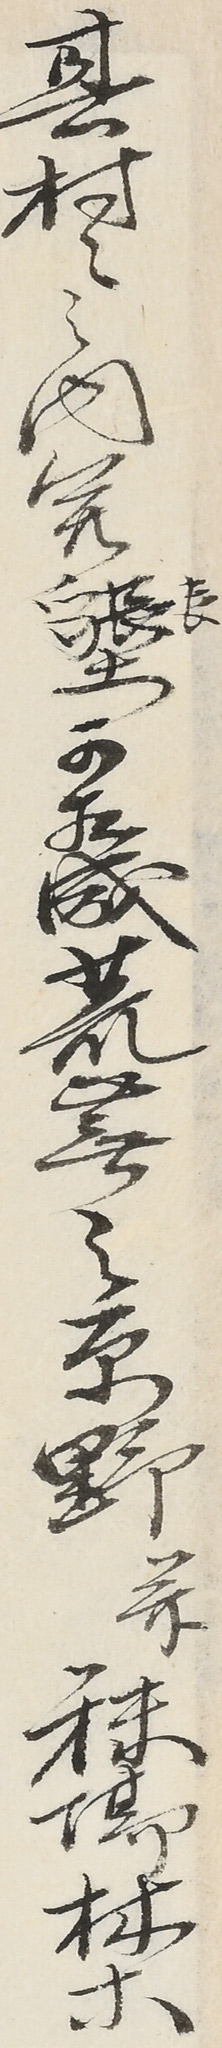其村々之内開墾可相成荒蕪之原野并抹場禁
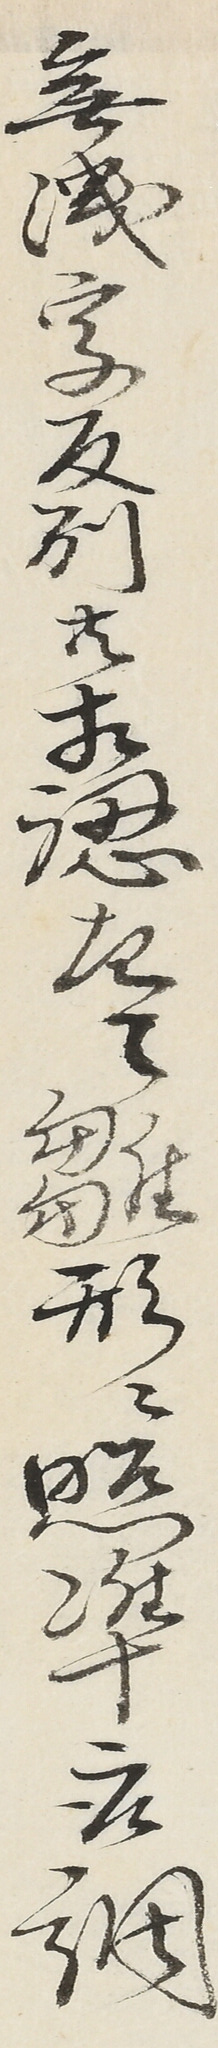無洩字反別共相認左て雛形ニ照準十取調
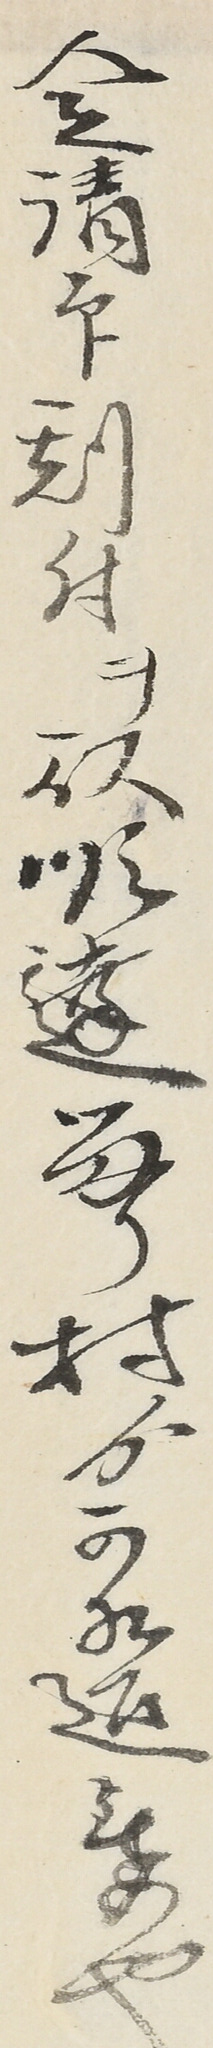全請印刻付ヲ以順達留り村ゟ可相返要也
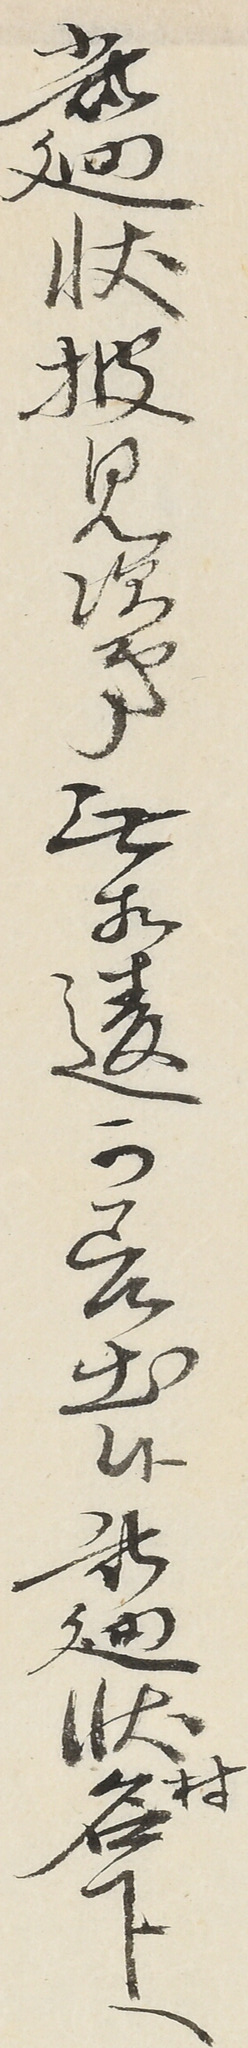此廻状披見次第無相違可差出候此廻状村名下へ
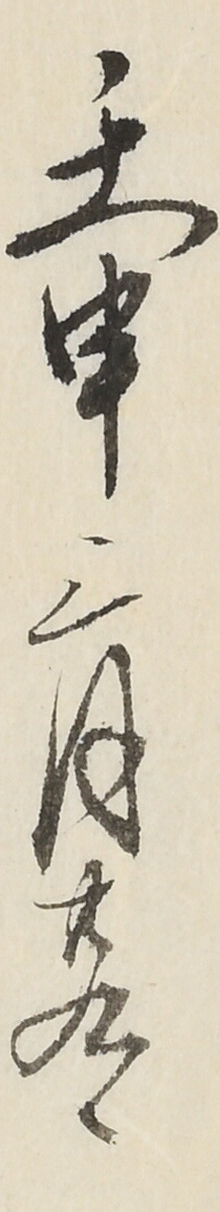壬申三月廿九日
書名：廻状（控）
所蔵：伊那市立高遠町図書館・合同会社AMANE
